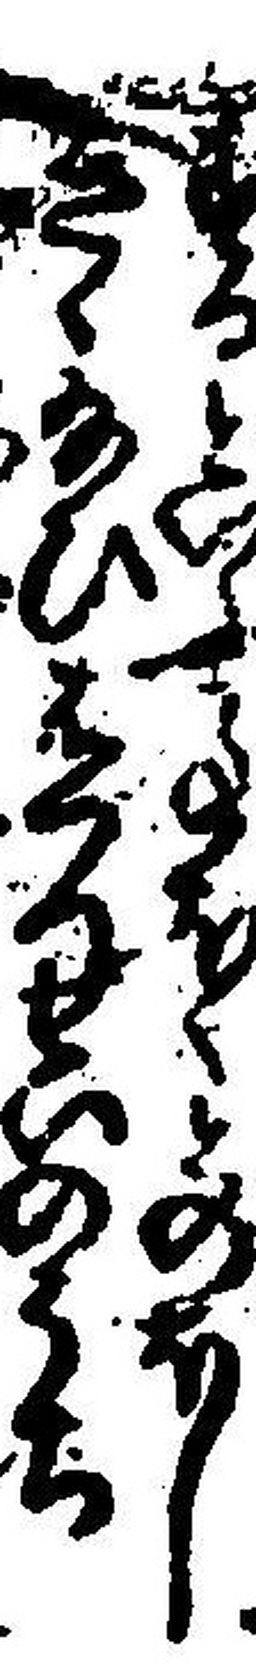きゝ給ひはくんせいのうち
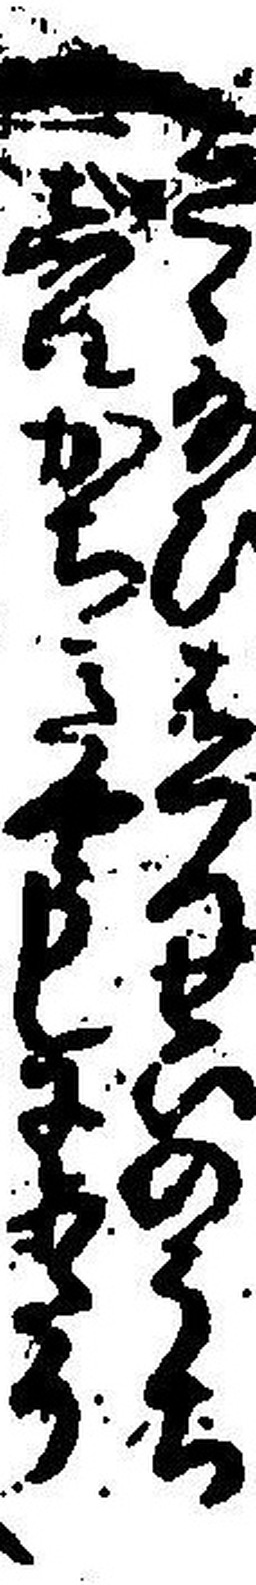一じんかちきやうしにあたり
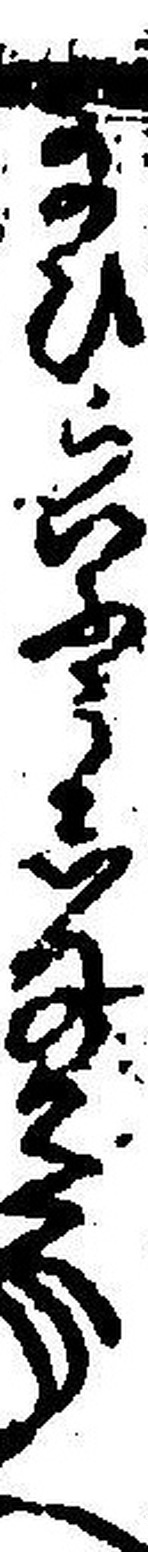給ひらいふうしんのかたへ
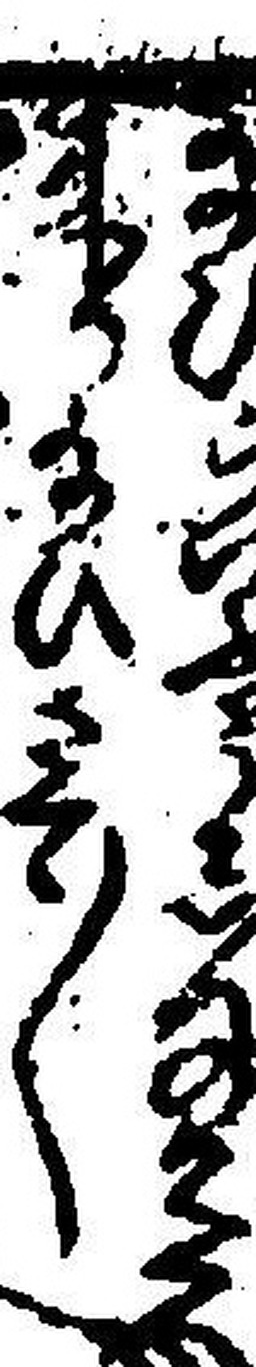来り給ひさて〳〵
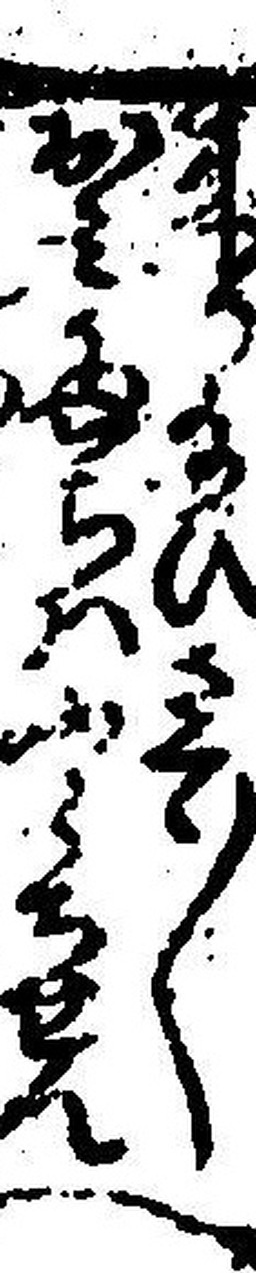おみたちはふらちせん
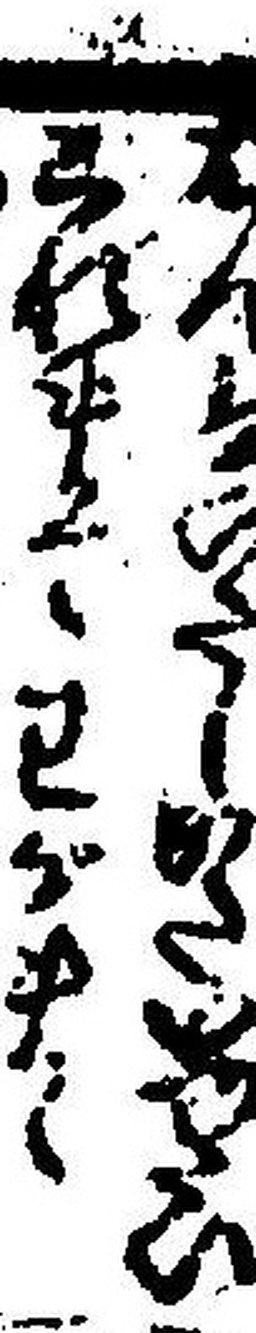これまでわがまゝ
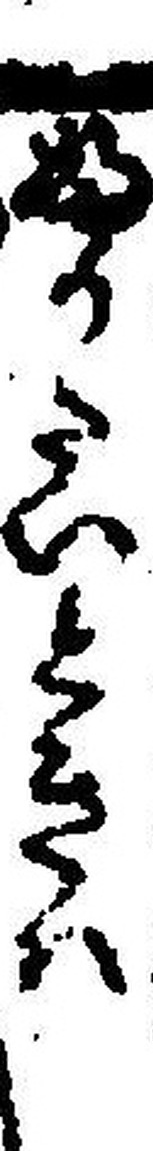ふりたいときは
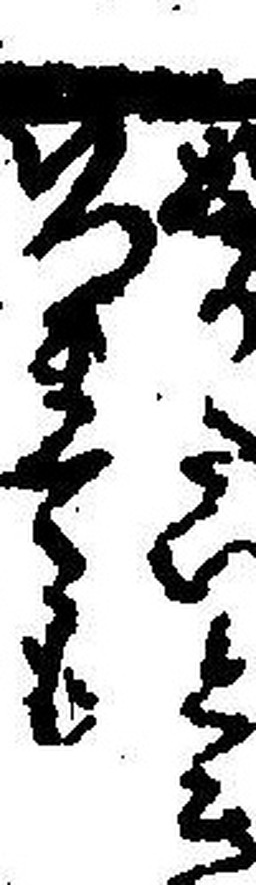いつまても
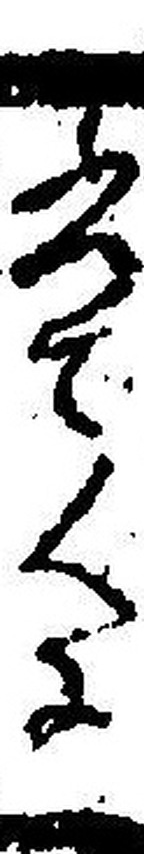ふつて人に
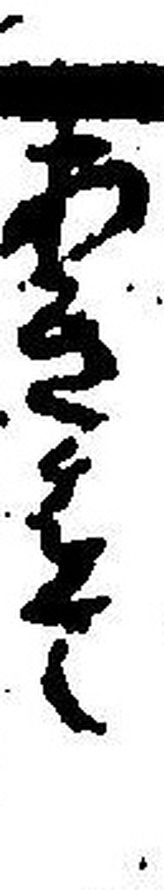あきはて
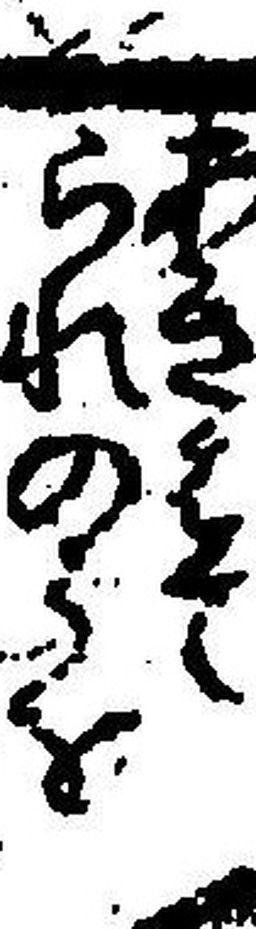られのらを
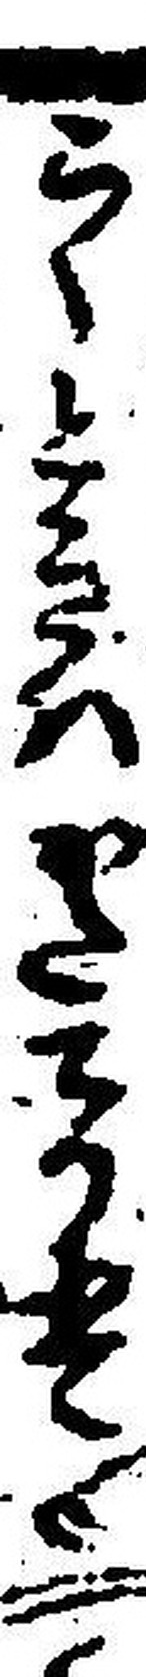こくときはやたてりにて
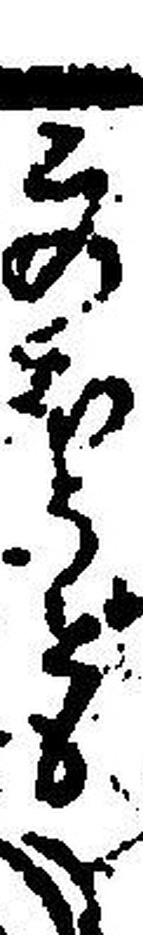このほうども
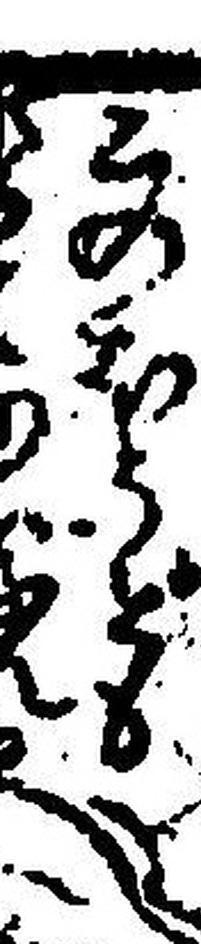このほうども
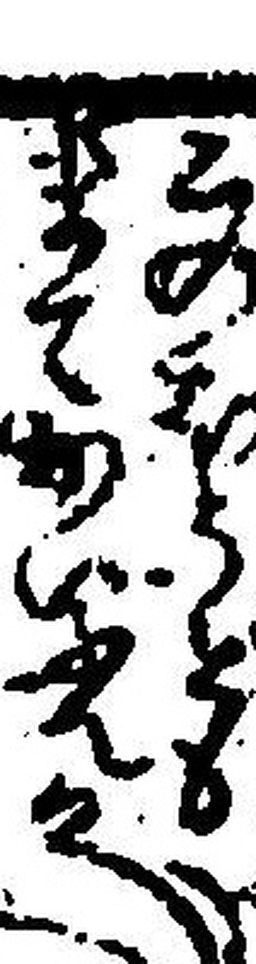まてかいふんか
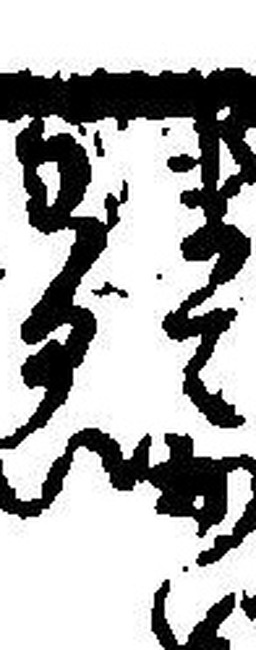わるい
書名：天竺儲之筋 / 市場通笑作
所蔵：東京大学総合図書館 General Library in the University of Tokyo, JAPAN
